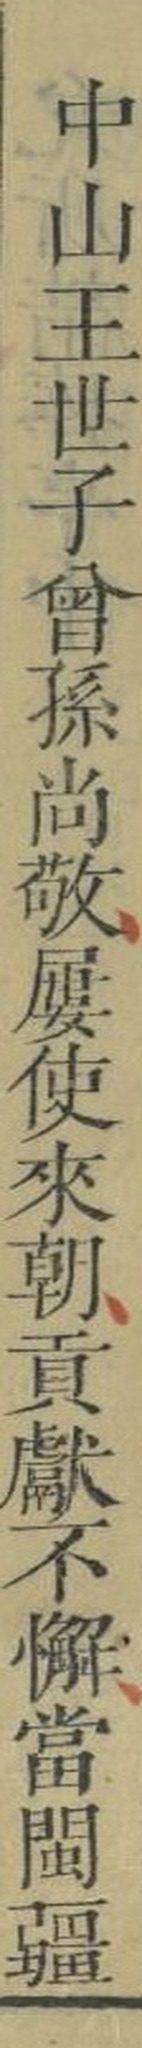中山王世子曾孫尚敬屢使來朝貢獻不懈當閩疆
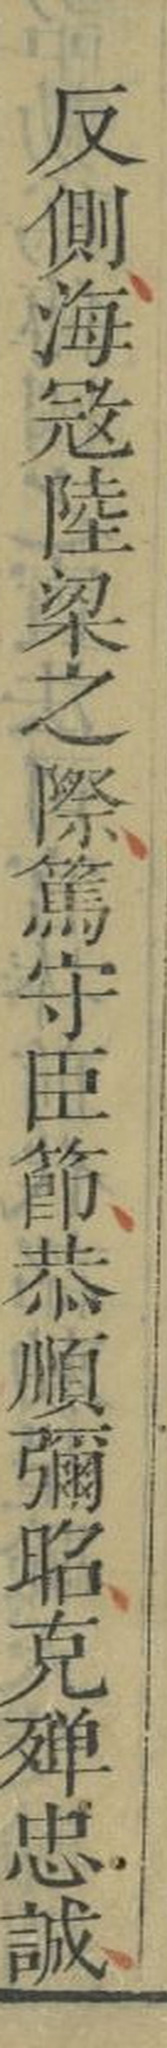反側海冦陸梁之際篤守臣節恭順彌昭克殚忠誠
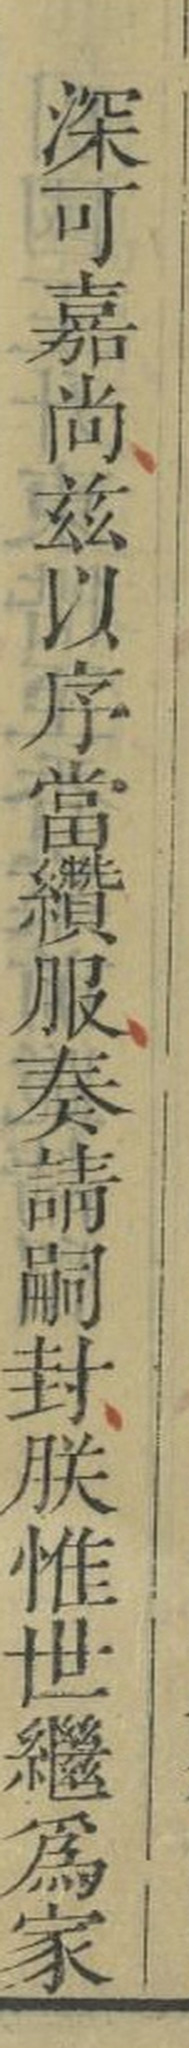深可嘉尚茲以序當纘服奏請嗣封朕惟世繼爲家
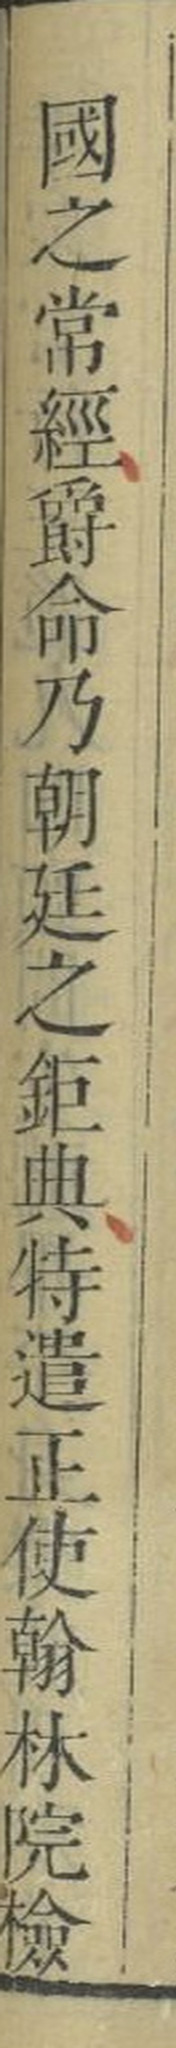國之常經爵命乃朝廷之鉅典特遣正使翰林院檢
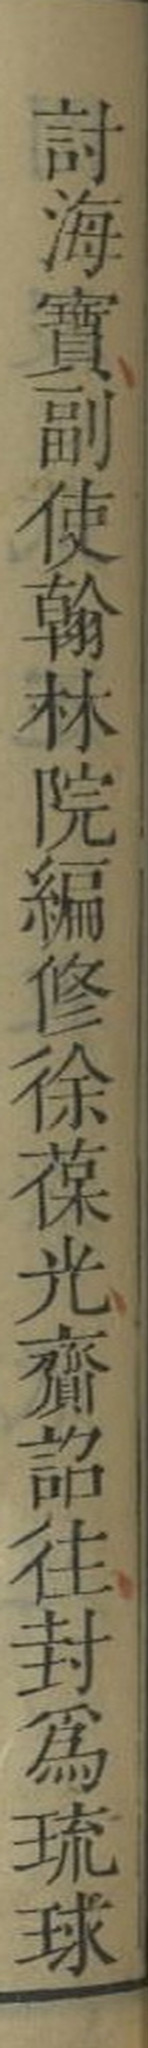討海寶副使翰林院編修徐葆光齎詔往封爲琉球
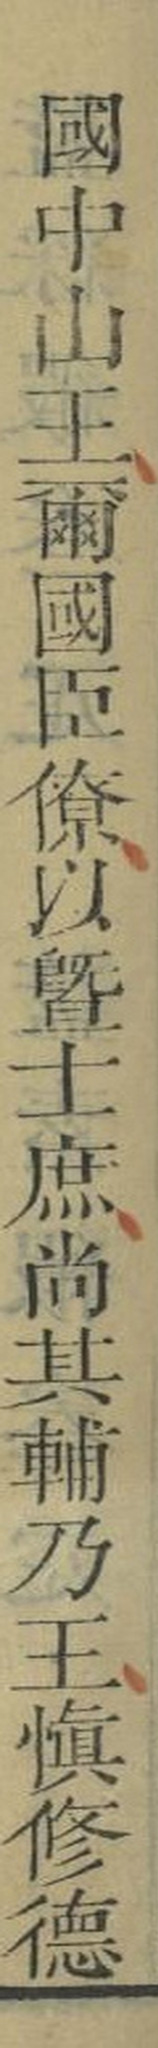國中山王爾國臣僚以曁士庶尚其輔乃王愼修德
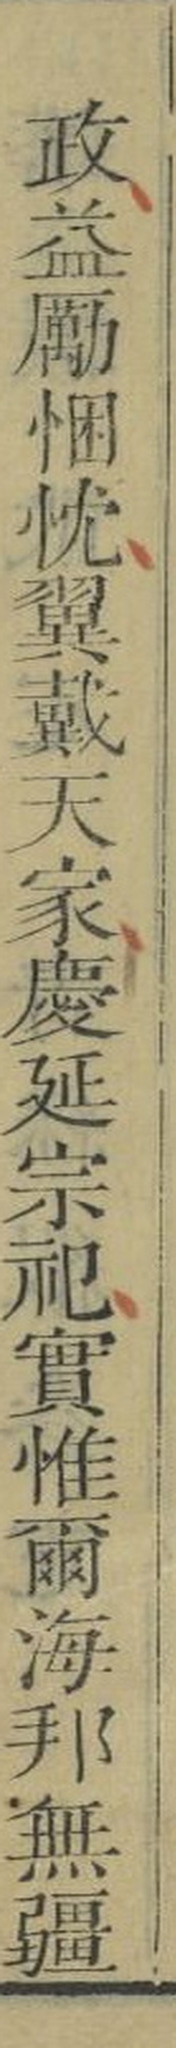政益勵悃忱翼戴天家慶延宗祀實惟爾海邦無疆
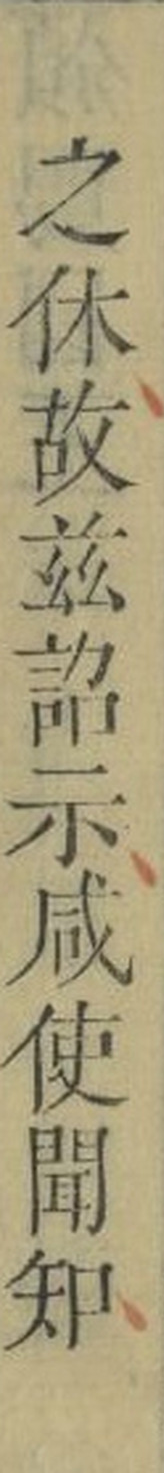之休故茲詔示咸使聞知
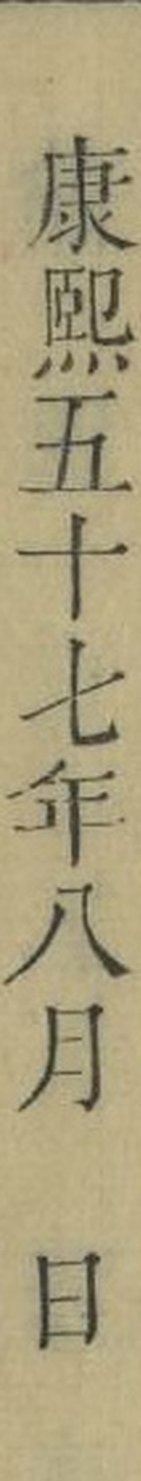康煕五十七年八月日
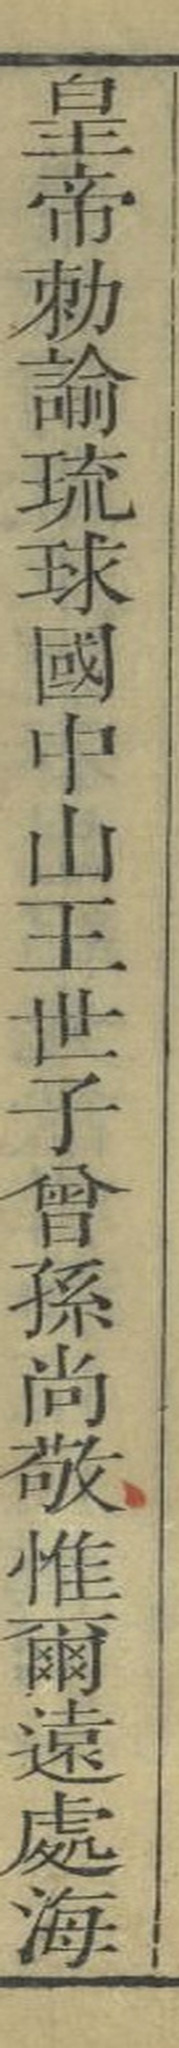皇帝勅諭琉球國中山王世子曾孫尚敬惟爾遠處海
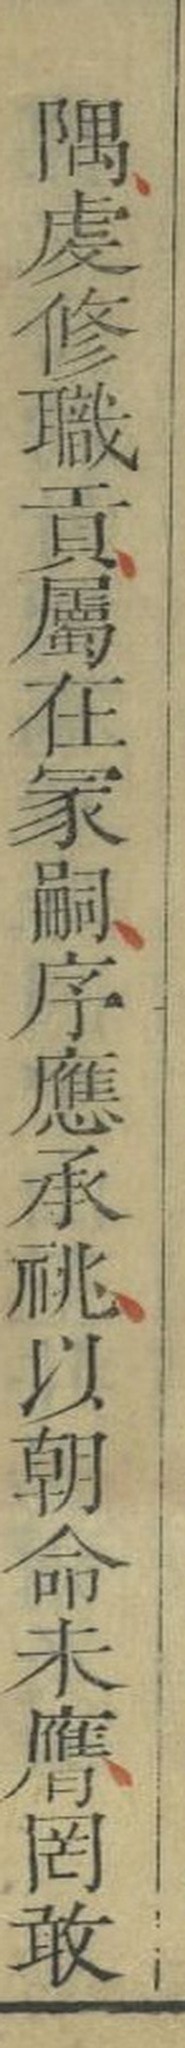隅虔修職貢屬在冡嗣序應承祧以朝命未膺罔敢
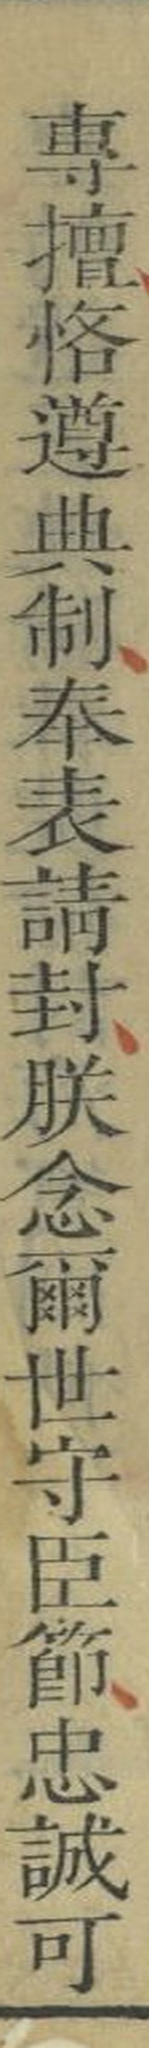專擅悋遵典制奉表請封朕念爾世守臣節忠誠可

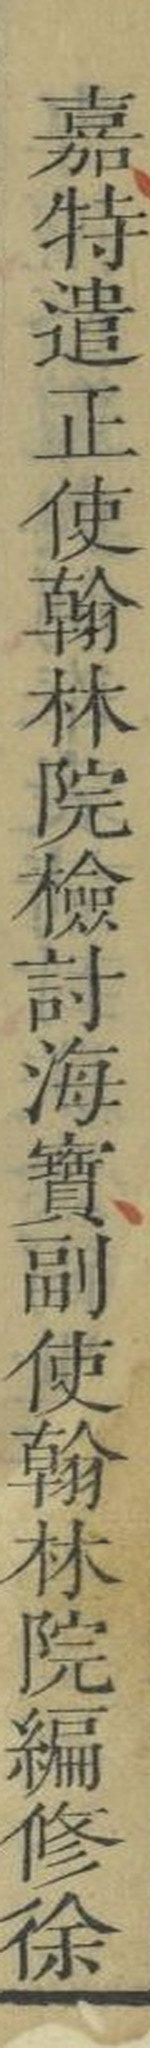嘉特遣正使翰林院檢討海寶副使翰林院編修徐
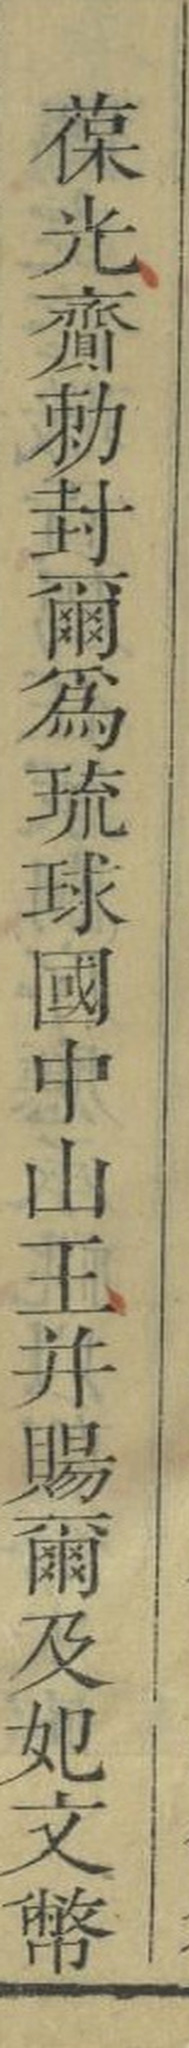葆光齎勅封爾爲琉球國中山王并賜爾及妃文幣
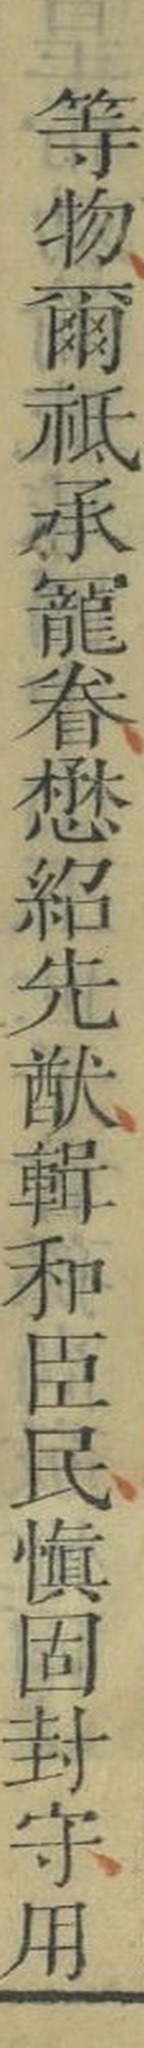等物爾祇承寵眷懋紹先猷輯和臣民愼固封守用
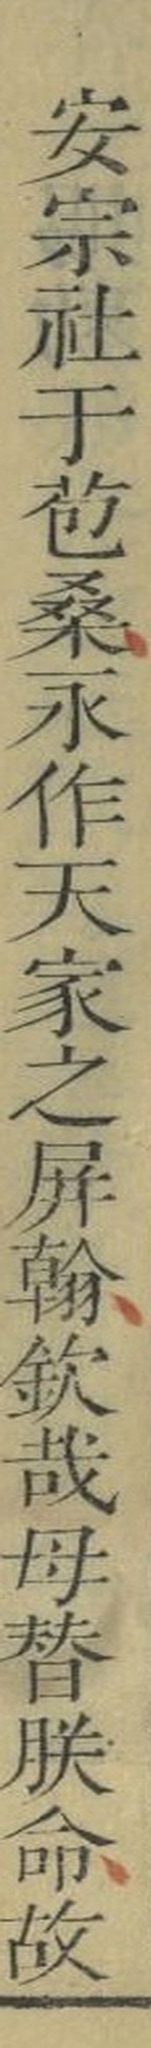安宗社于苞桑永作天家之屏翰欽哉母替朕命故
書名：中山伝信録 巻一、巻二
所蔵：University of the Ryukyus Library
